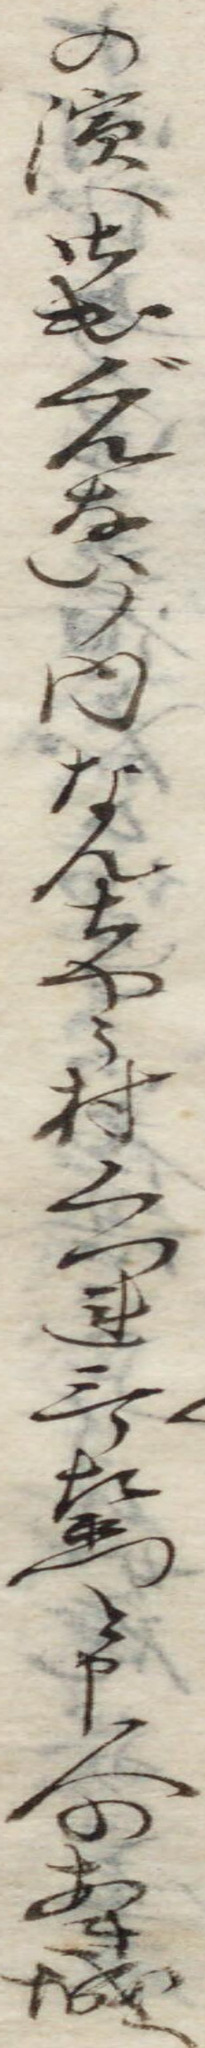の浜へ御出ぐんないノ内なんちやう村くつれ三郎左衛門と申人のあき城へ
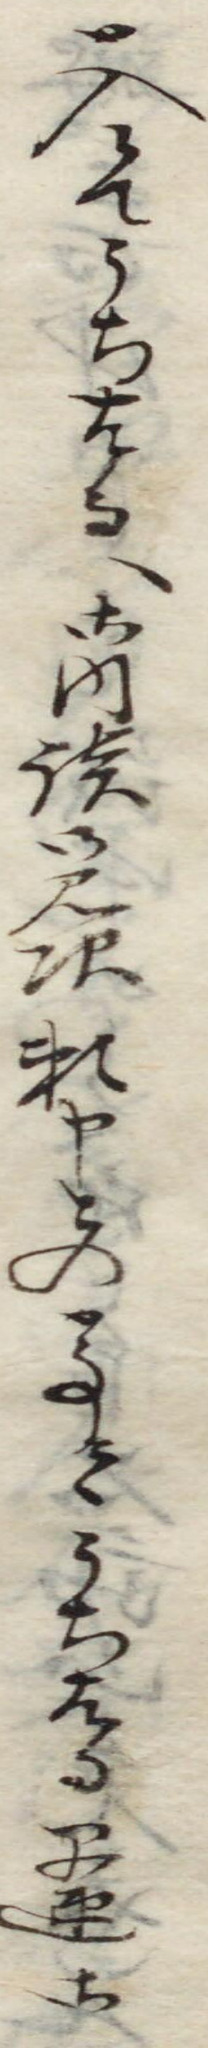御入にてうちはるへ御内談御見訳頼申との御事候うちはる早速御
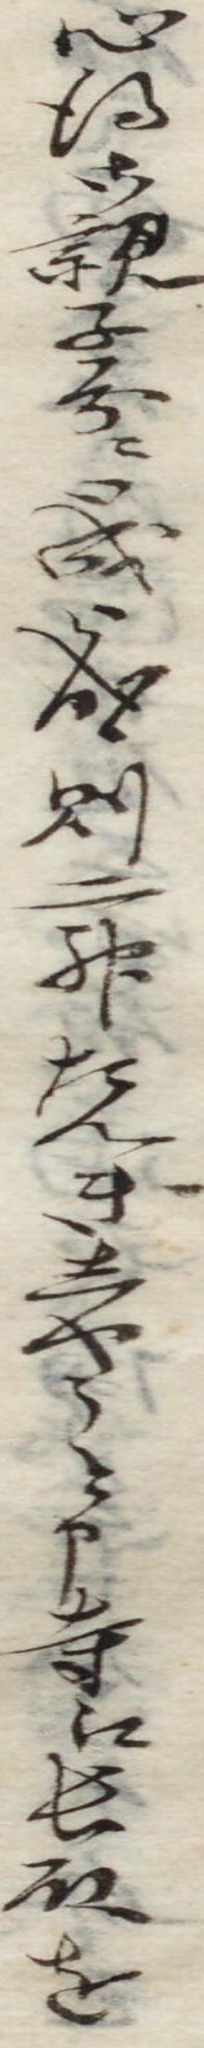心得御親子分に御成被成候則二神たんきしやうと申寺え長殿を
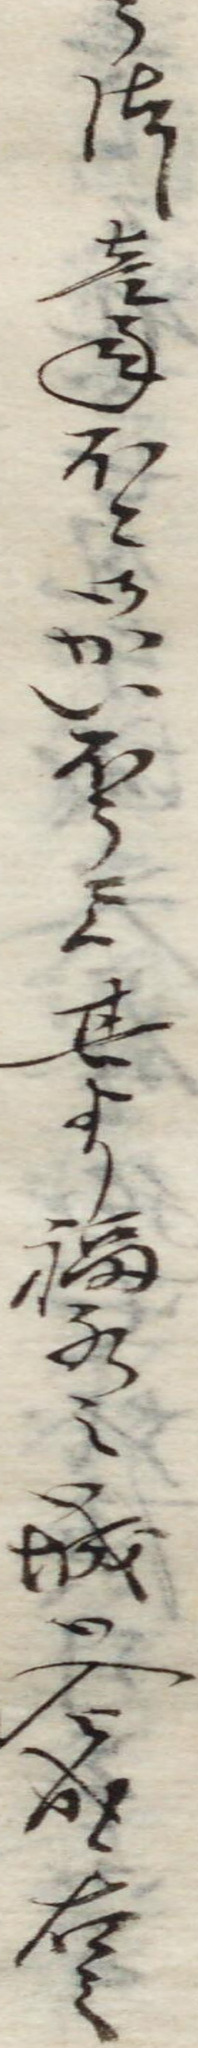うつし壱年ほと御かいほうに候其より福水之御城御入被成候右之
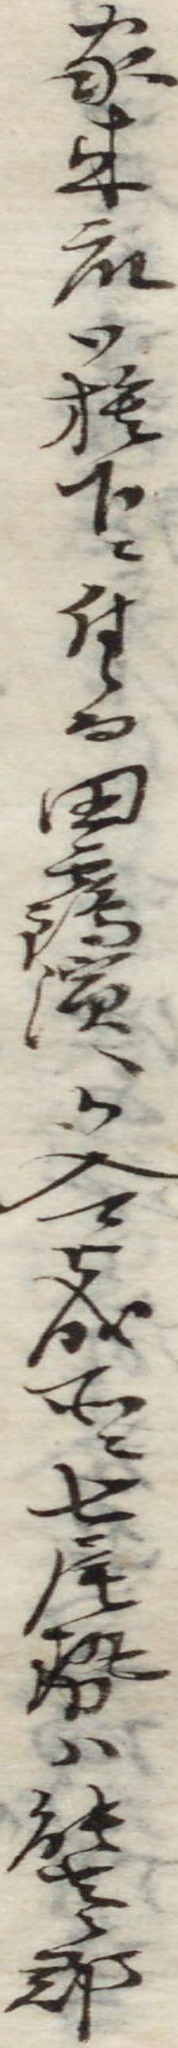家来衆御権下に付候而田鶴浜へ御入可被成所に七尾勢は能登之郡
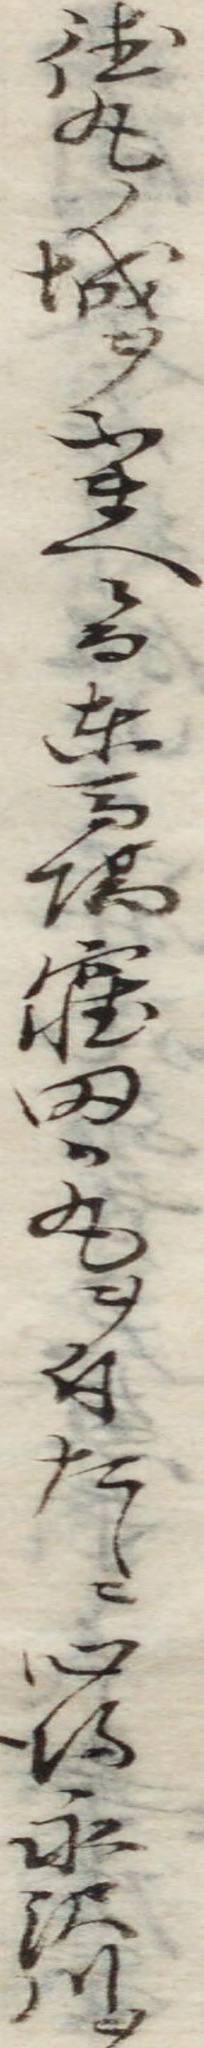徳丸ノ城をふまへに而東馬場窪田か丸を付たしに心得永沢川を
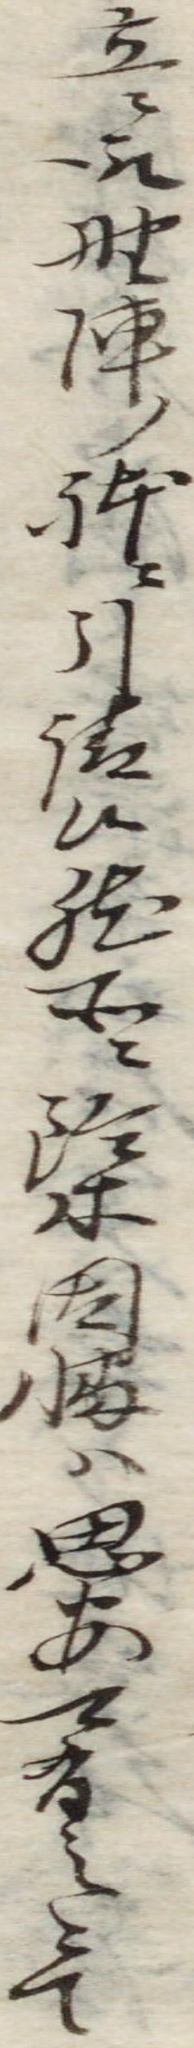立に取野陣ノ躰に引請候然所に鈴木因幡は思安可有之とて
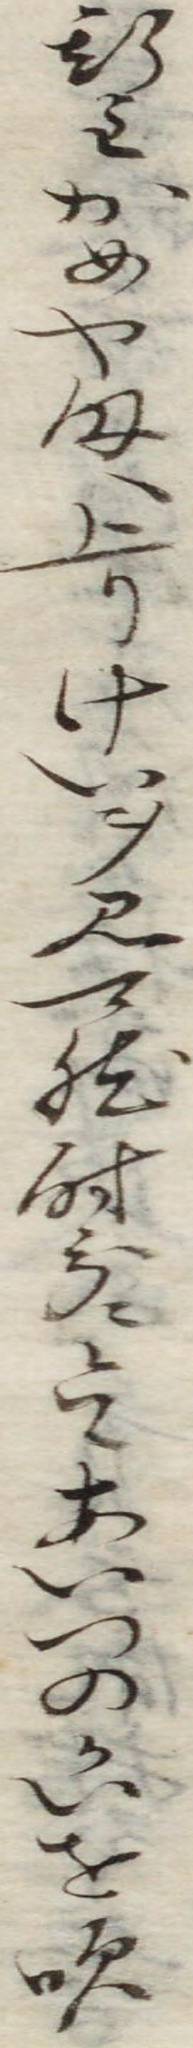期主かめやまへ上りけいを見可然時分に候はゝあいつのかいを吹
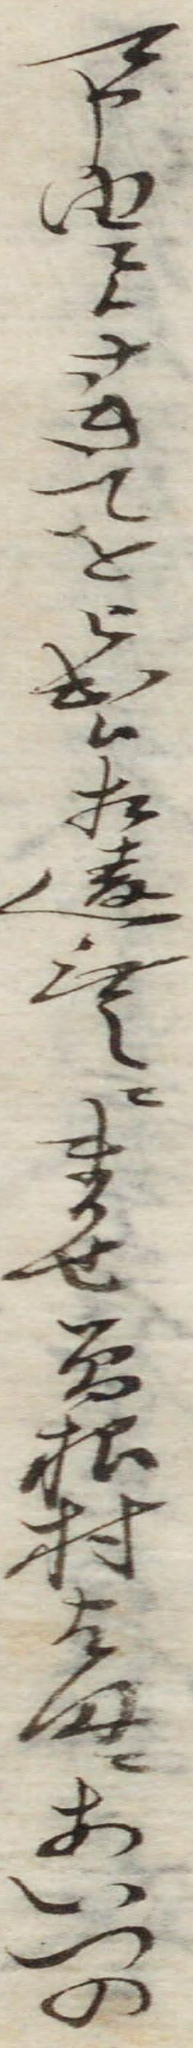可申由に候さきてを被出候相違無之にまかせ曽根村はまにあいつの
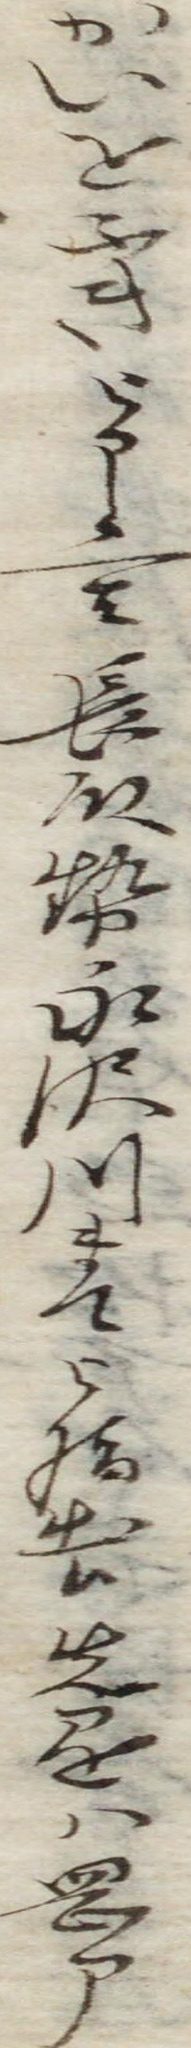かいをふき被申候へは長殿勢永沢川まて被指出候先懸は岡部
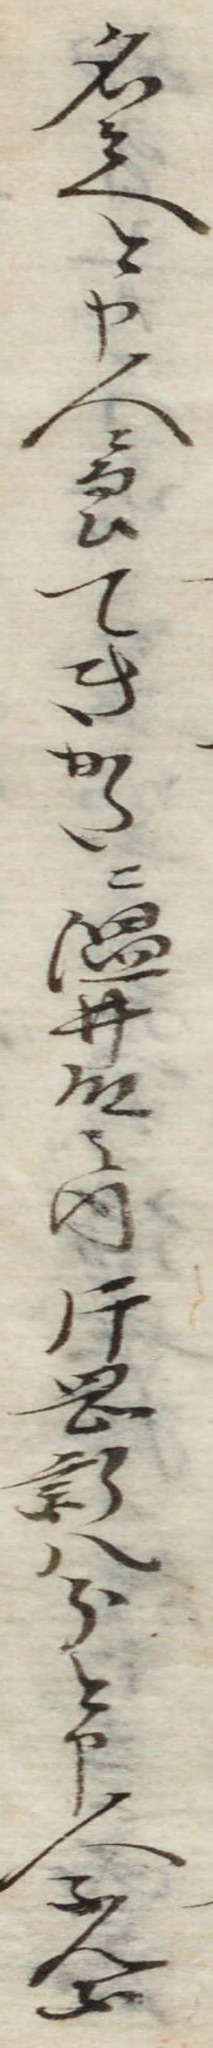名兵衛と申人に而候てきかたに温井殿之内片岡新八郎と申人ふんふ
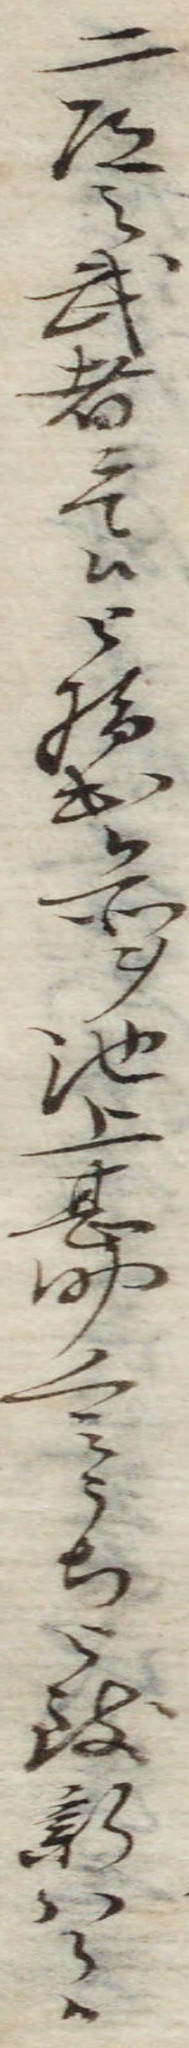二道之武者にて候被指出候所を池上甚助くみうち被致新八郎か
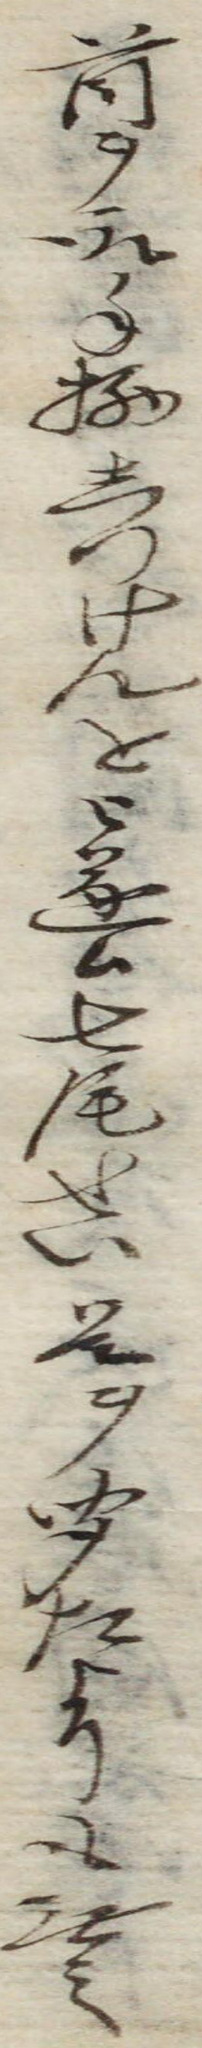首を取手柄しつけんを被遂候七尾せい是を聞たよりも無之
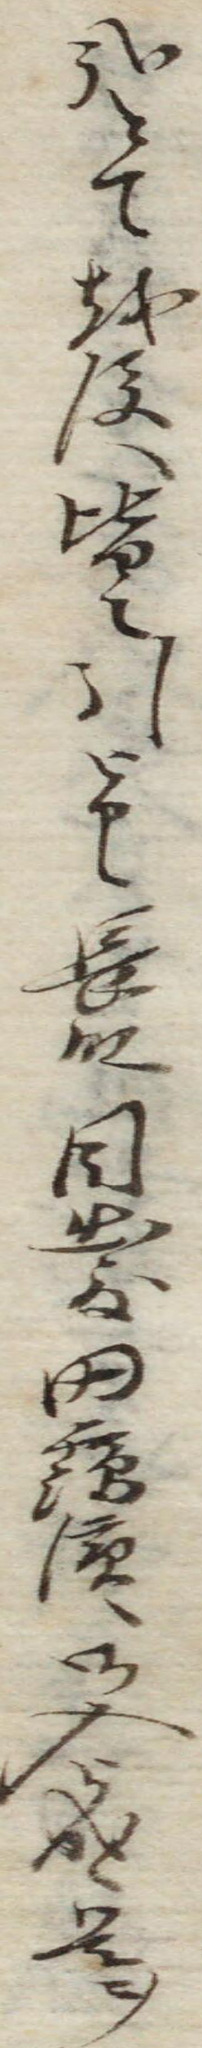哉とて越後へ皆々引被申候長殿目出度田鶴浜へ御入被成候是を

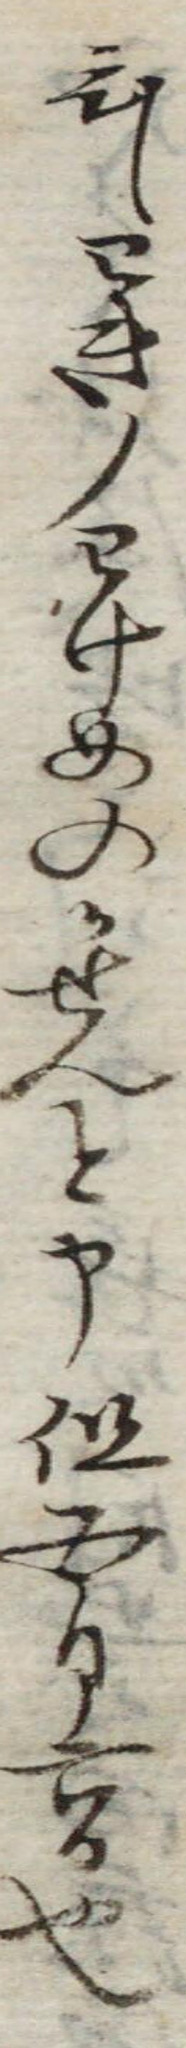ひしわきノわけめのかせんと申但五月六日也
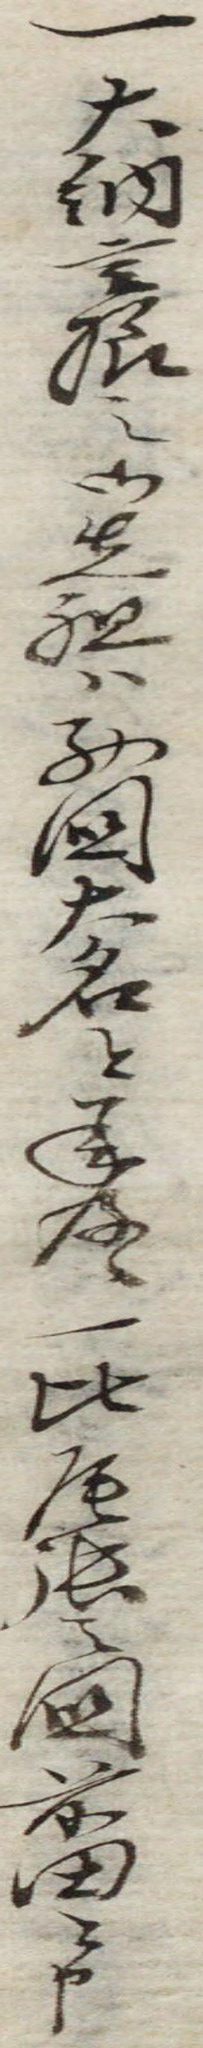一大納言様之御先祖は西国大名と承及候一比尾張之国前田と申
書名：古老紀談等
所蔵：Ishikawa Prefectural Library
